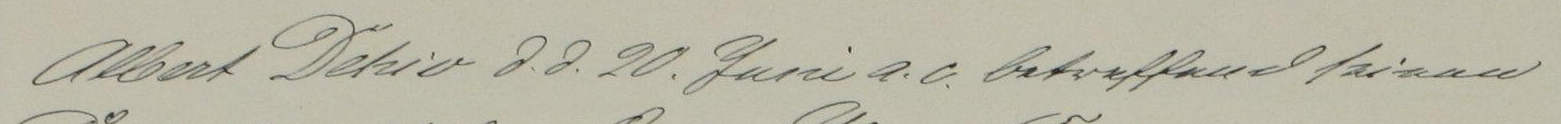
Albert Dehio d.d. 20. Juni a.c. betreffend seinen
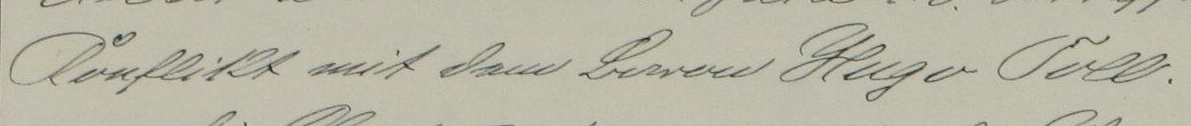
Konflikt mit dem Baron Hugo Toll.
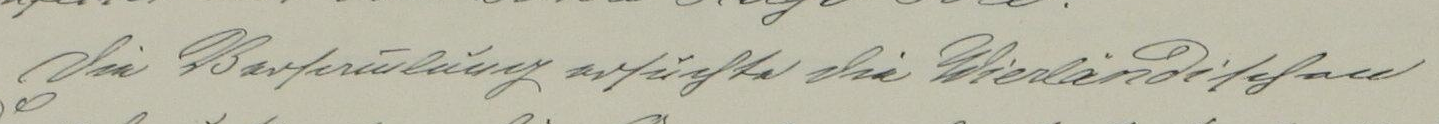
Die Versammlung ersuchte die Wierländischen
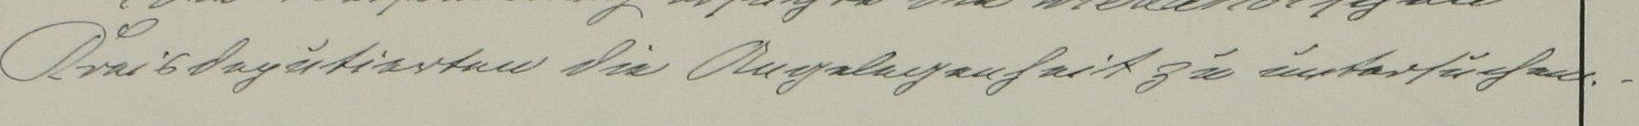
Kreisdeputierten die Angelegenheit zu untersuchen.
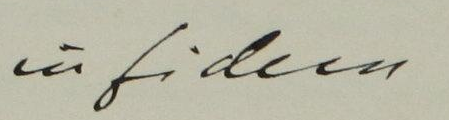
in fidem
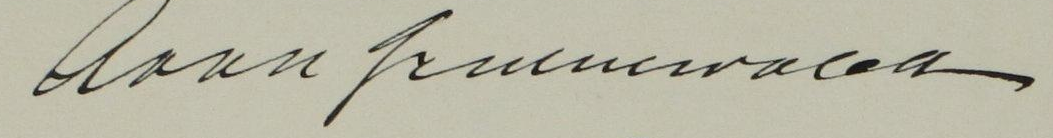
A. von Gruenewaldt
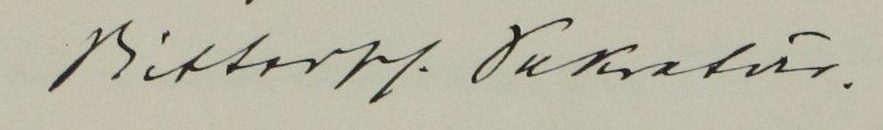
Rittersch. Sekretär
